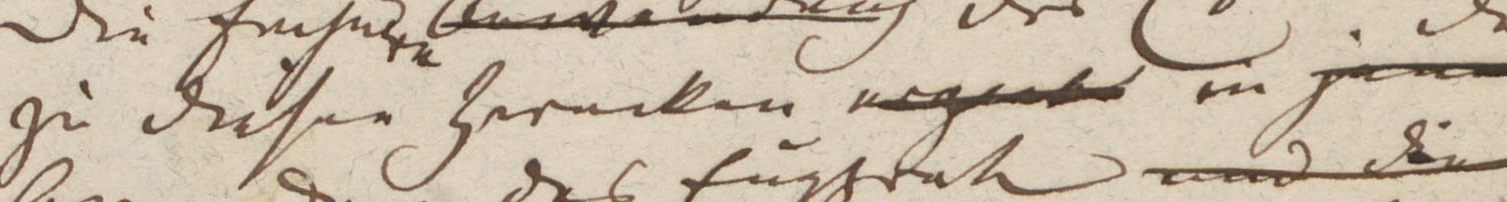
zu diesen Zwecken ergab in jenen den
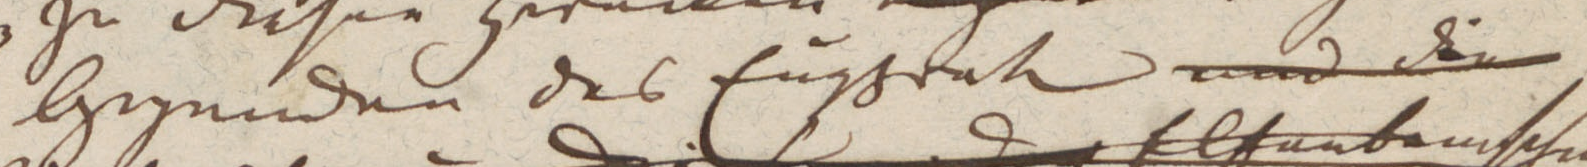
Gegenden des Euphrat und die
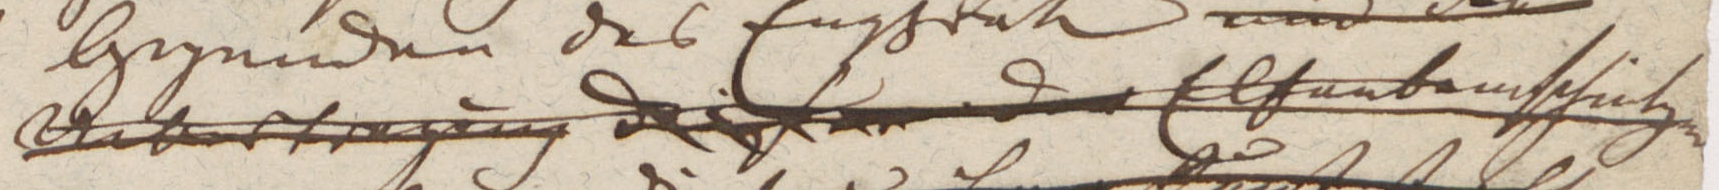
Uebertragung dieser der Elfenbeinschnitzen
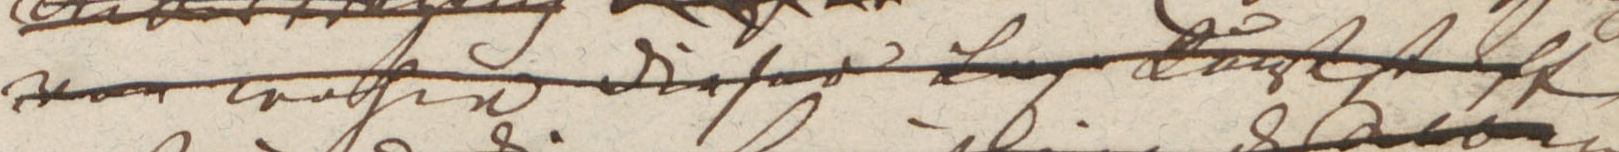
von wohin dieser Luxu Kunststoff
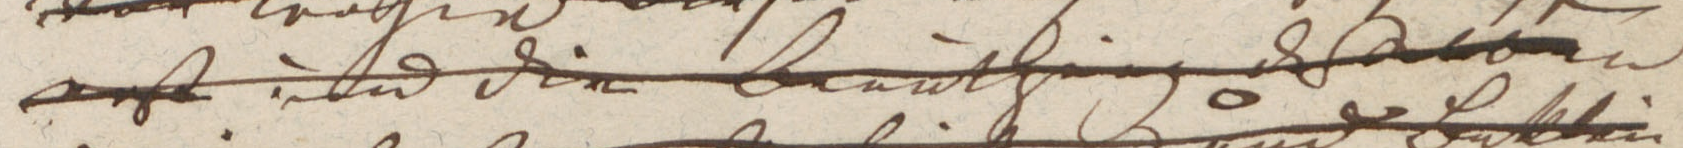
erst und die Benutzung desselben
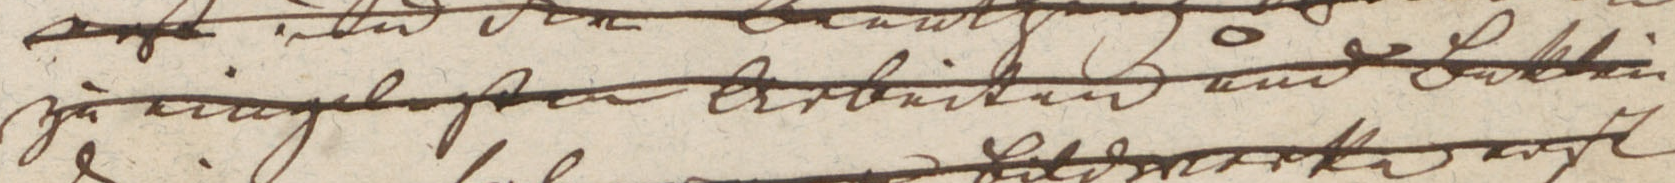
zu eingelegten Arbeiten und Beklei-
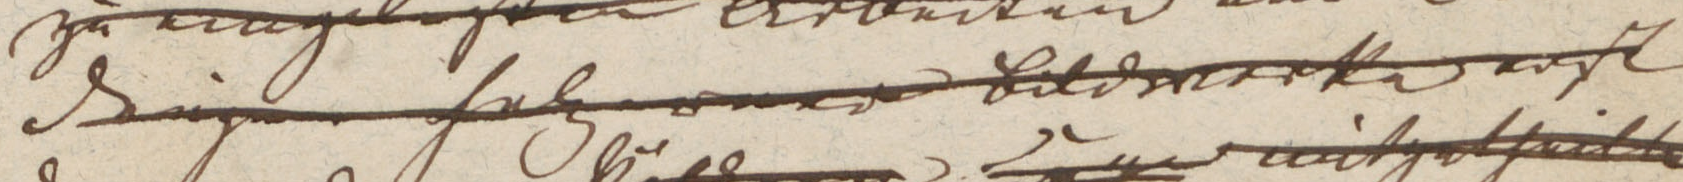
dungen holzerner Bildwerke erst
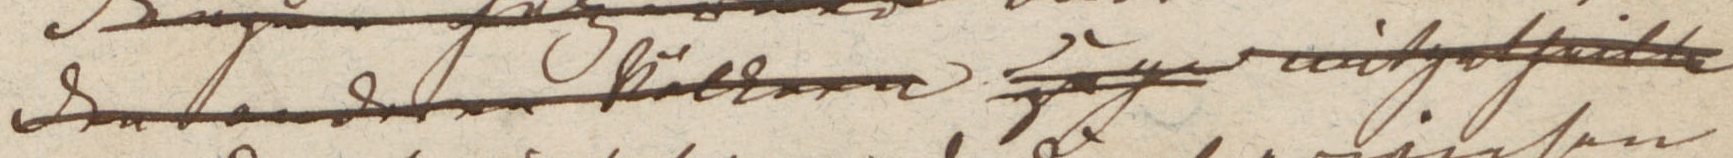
den anderen Völkern zuge mitgetheilt
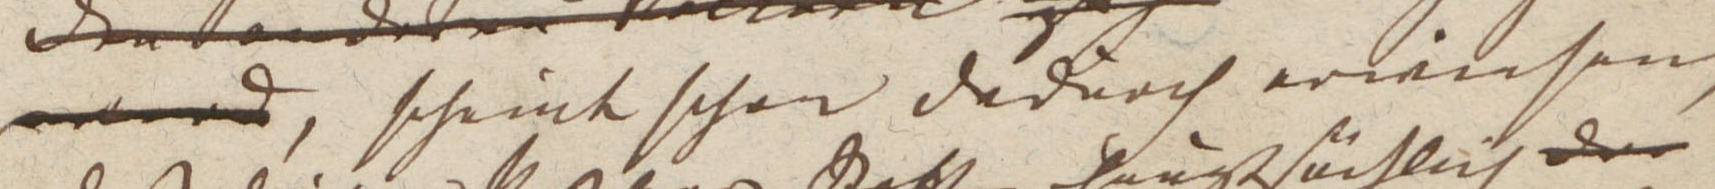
ward, scheint schon dadurch erwiesen,
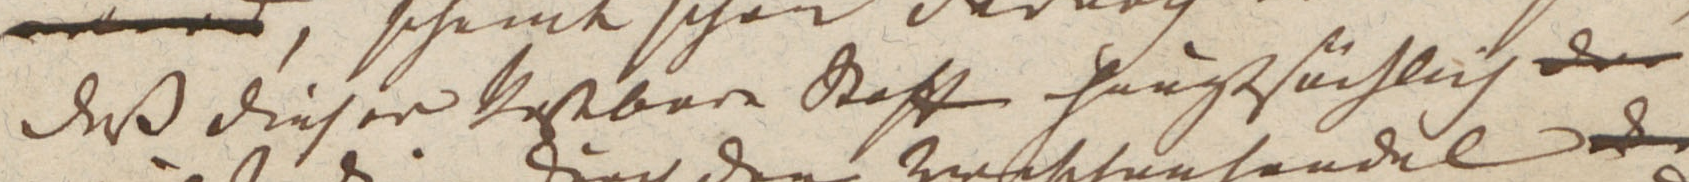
dass dieser kostbare Stoff hauptsächlich der
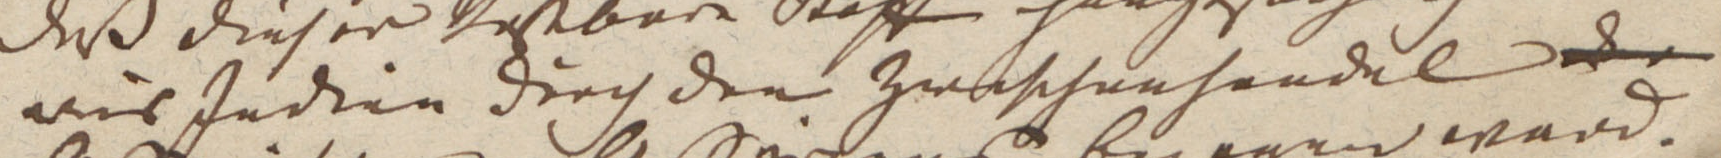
aus Indien durch den Zwischenhandel der
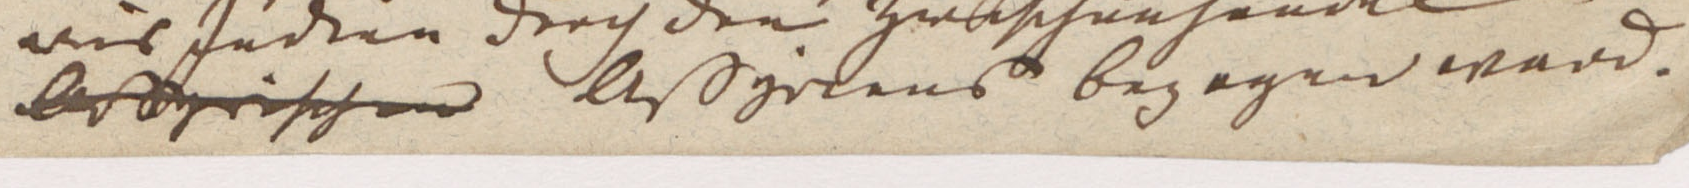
Assyrischen Assyriens bezogen ward.
